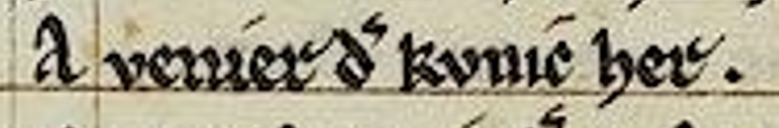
Avenier d(er) kvnic her.
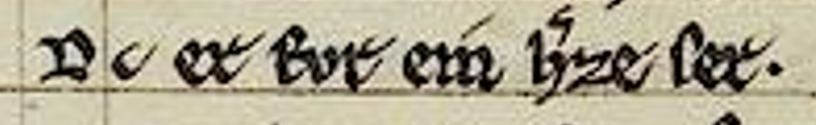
D(az) er fvr ein h(er)ze ſer.
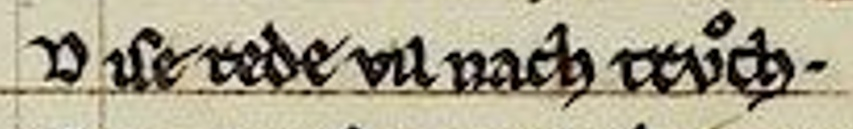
Diſe rede vil nach trv°och.
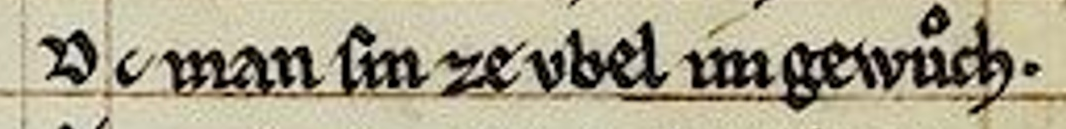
D(az) man ſin ze vbel im gewu°och.
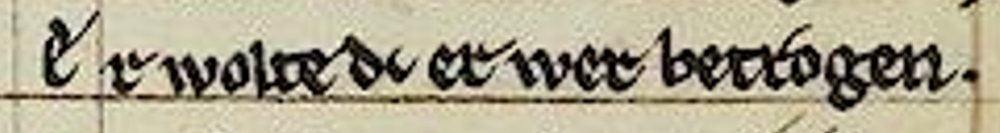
Er wolte d(az) er wer betrogen.
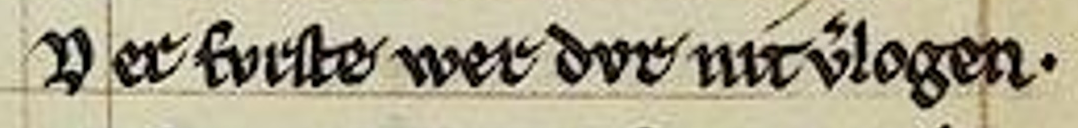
Der fvrſte wer dvr nit v(er)logen.
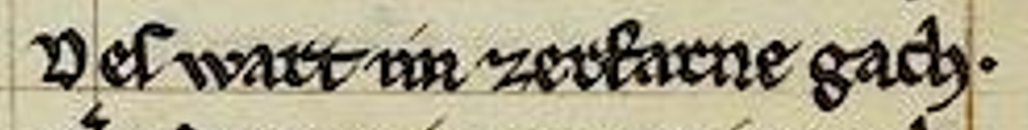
Deſ wart im zerfarne gach.
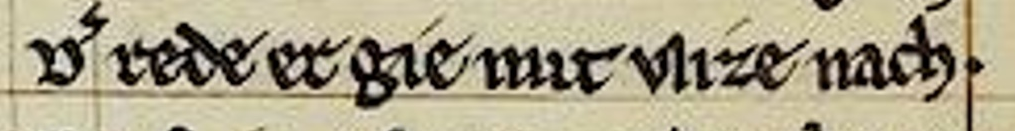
D(er) rede er gie mit vlize nach.
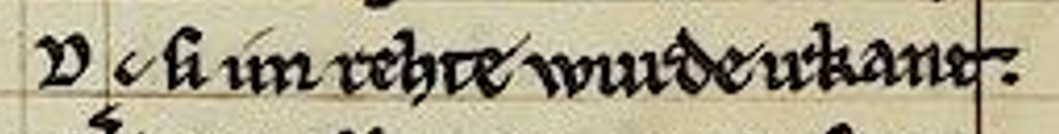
D(az) ſi im rehte wurde irkant.
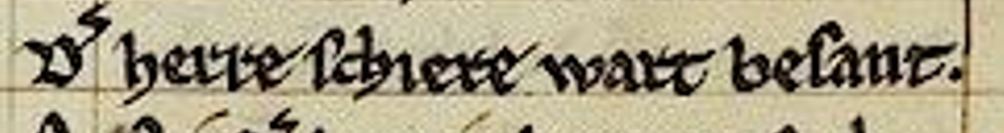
D(er) herre ſchiere wart beſant.
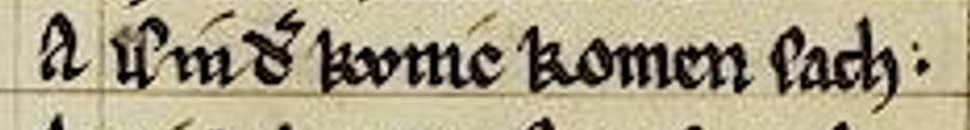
Alſ in d(er) kvnic komen ſach.
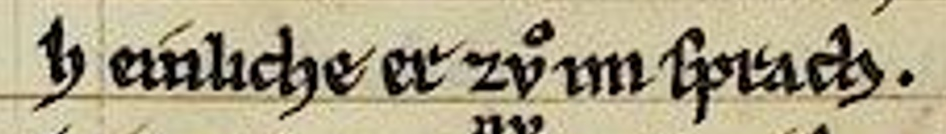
Heinliche er zv°o im ſprach.
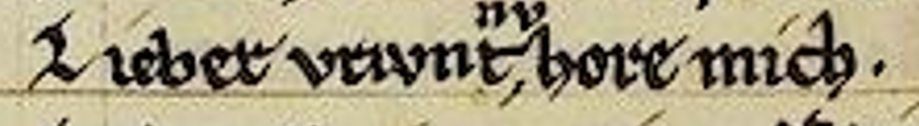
Lieber vrivnt °(nv) hore mich.
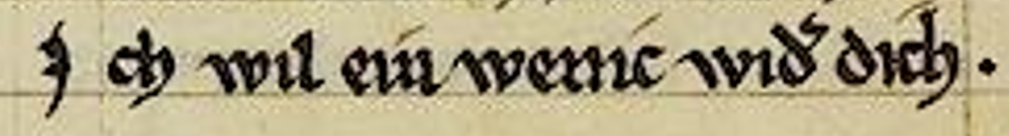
Ich wil ein wenic wid(er) dich.
